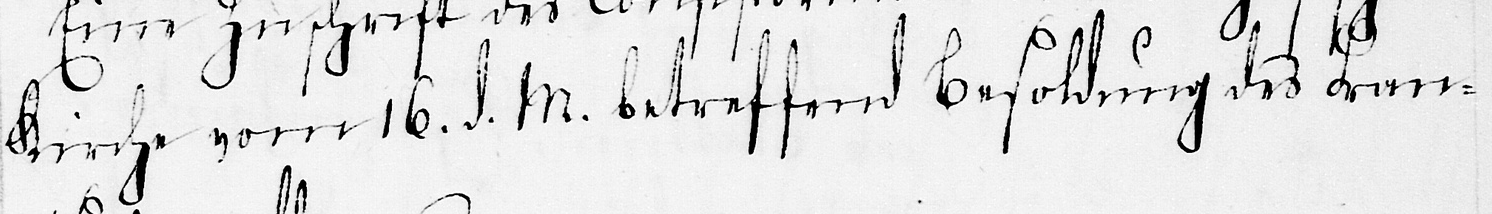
Kirche vom 16. d. M. betreffend Besoldung des Fran¬
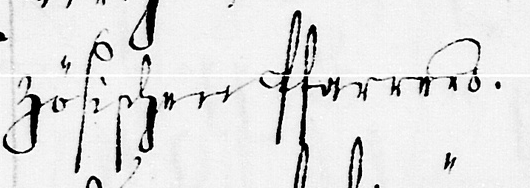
zösischen Pfarrers.
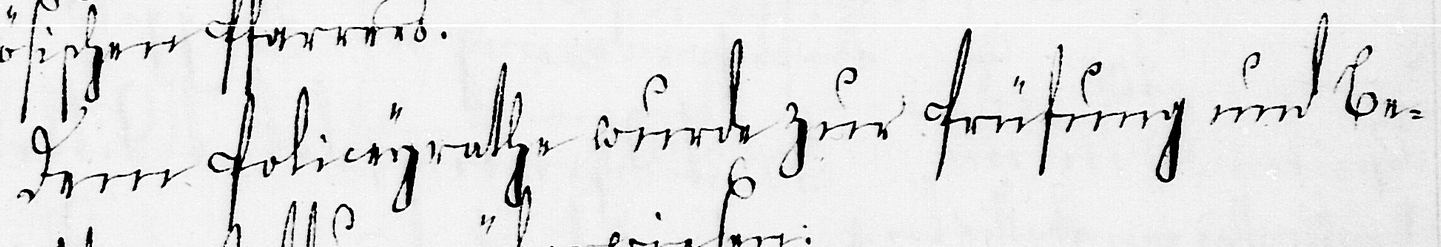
Dem Policeyrathe wurde zur Prüfung und Be¬
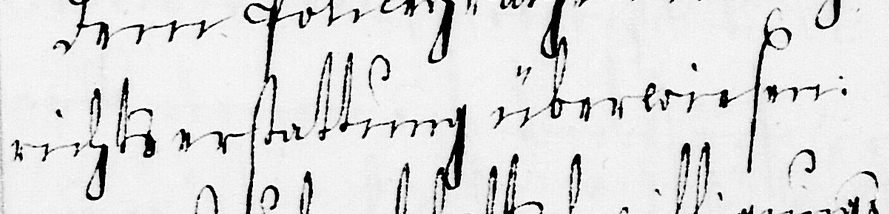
richtserstattung überwiesen:
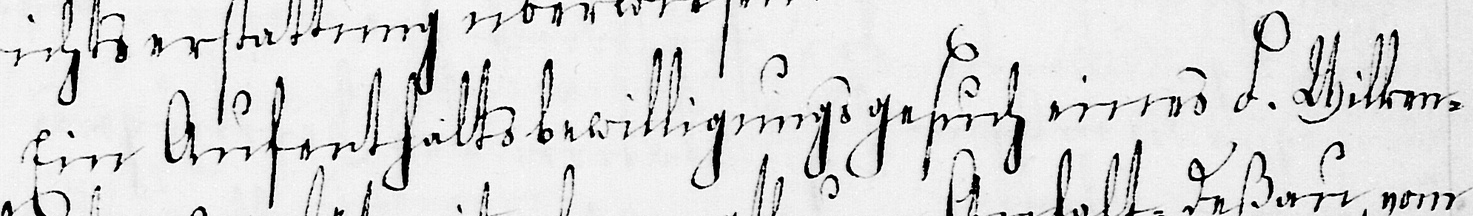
Ein Aufenthaltsbewilligungsgesuch eines F. Wilken¬
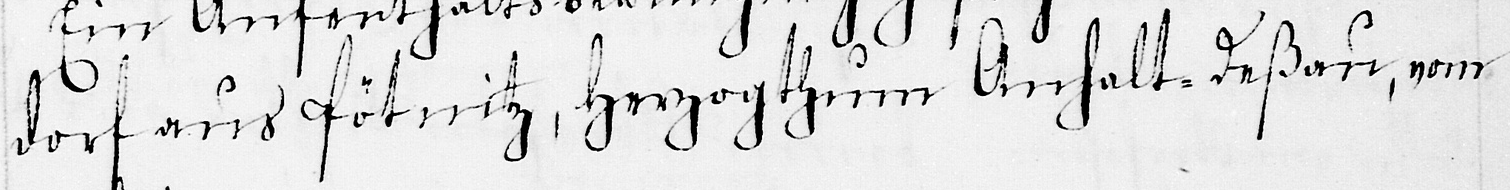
dorf aus Pötnitz, Herzogthum Anhalt-Deßau, vom
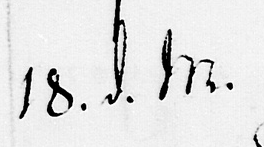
18. d. M.
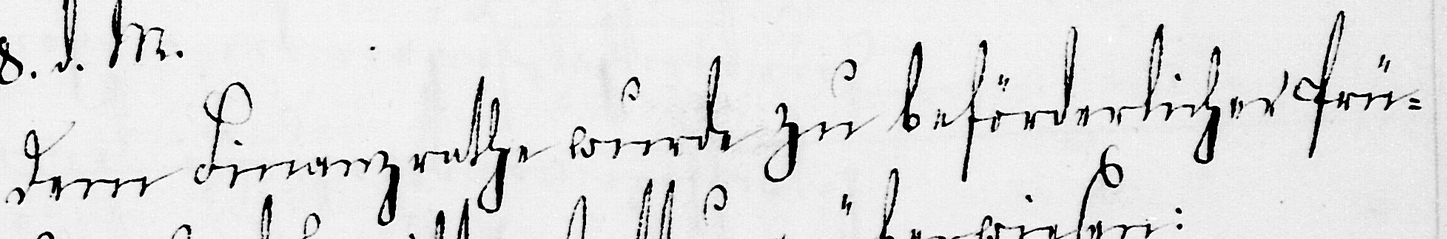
Dem Finanzrathe wurde zu beförderlicher Prü¬
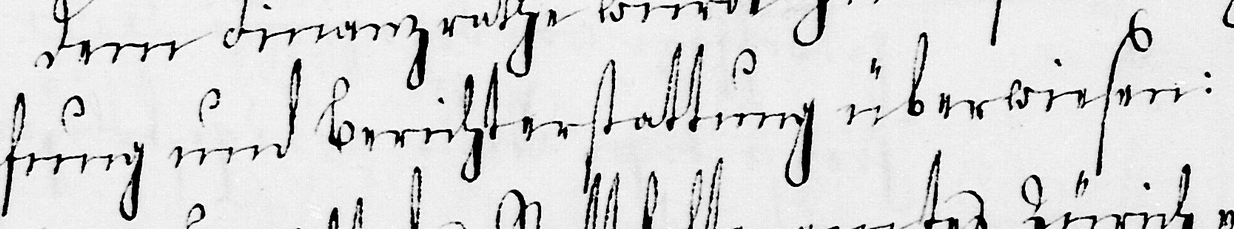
fung und Berichterstattung überwiesen:
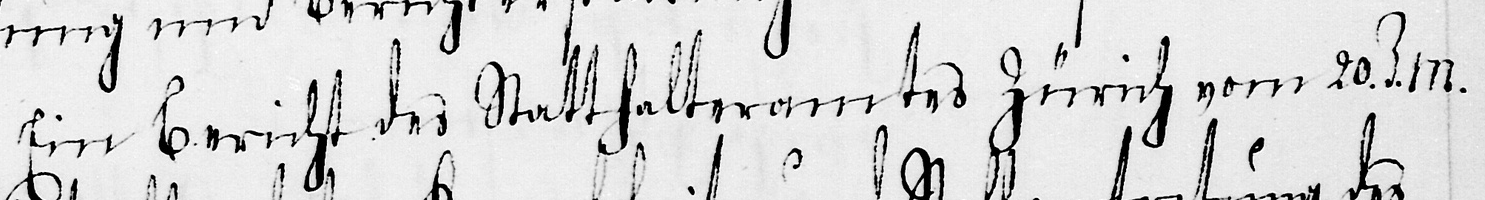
Ein Bericht des Statthalteramtes Zürich vom 20. d. M.
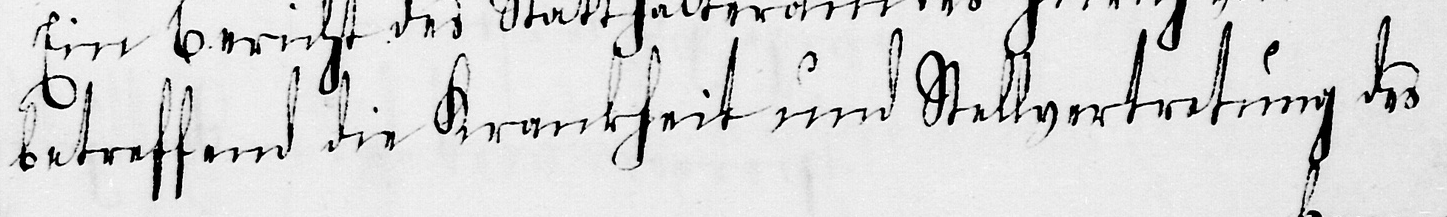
betreffend die Krankheit und Stellvertretung des
